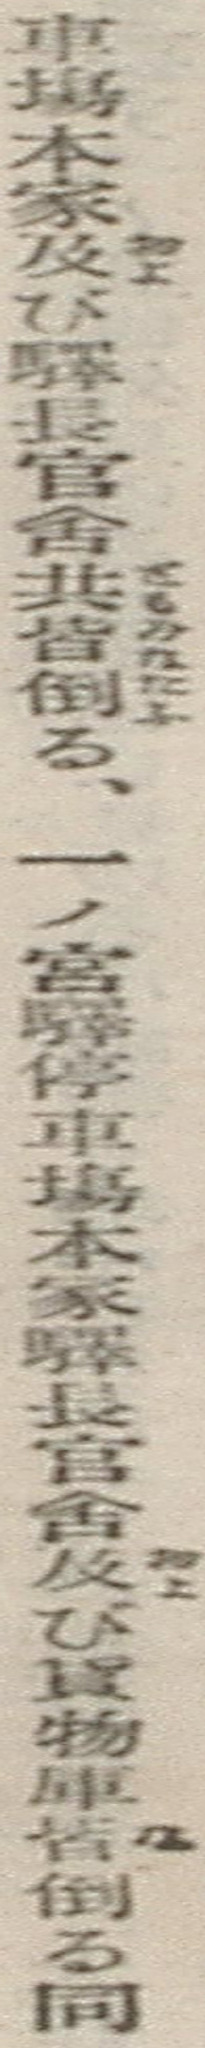車場本家及び驛長官舎共皆倒る、一ノ宮驛停車場本家驛長官舎及び貨物庫皆倒る同
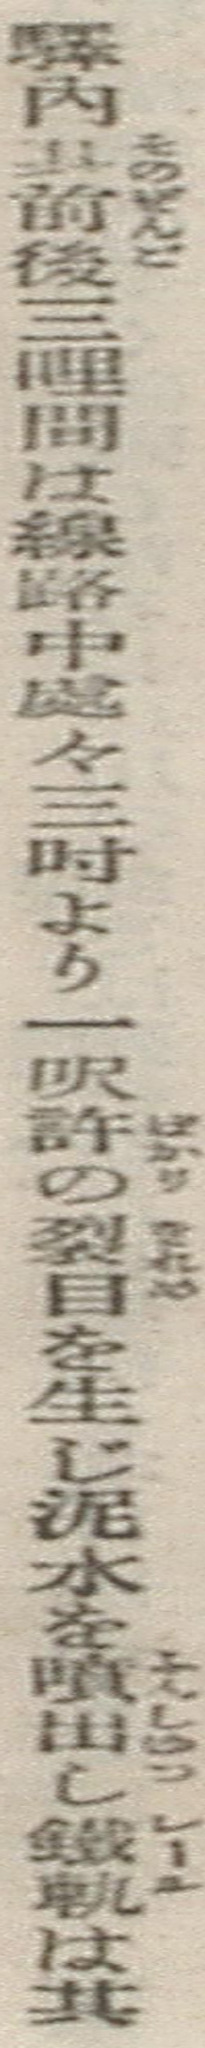驛内其前後三哩間は線路中處々三吋より一呎許の裂目を生じ泥水を噴出し鐡軌は其
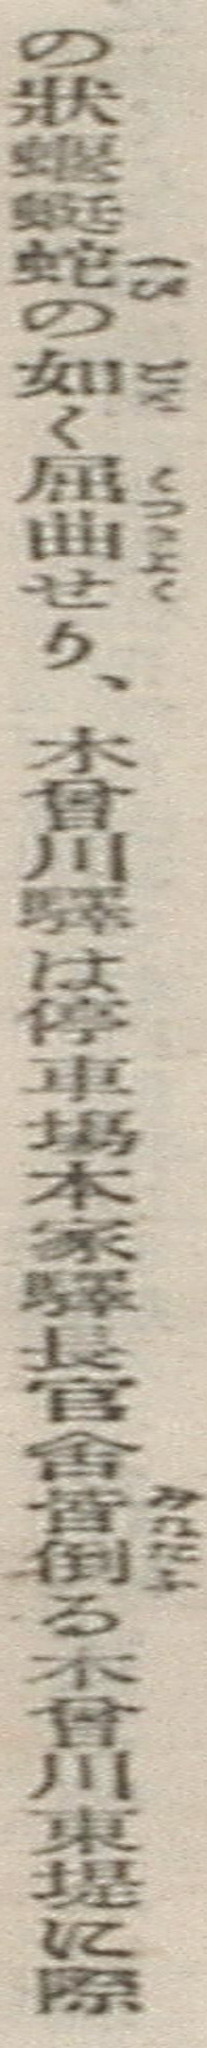の状蝘蜒蛇の如く屈曲せり、木曽川驛は停車場本家驛長官舎皆倒る木曽川東堤に際
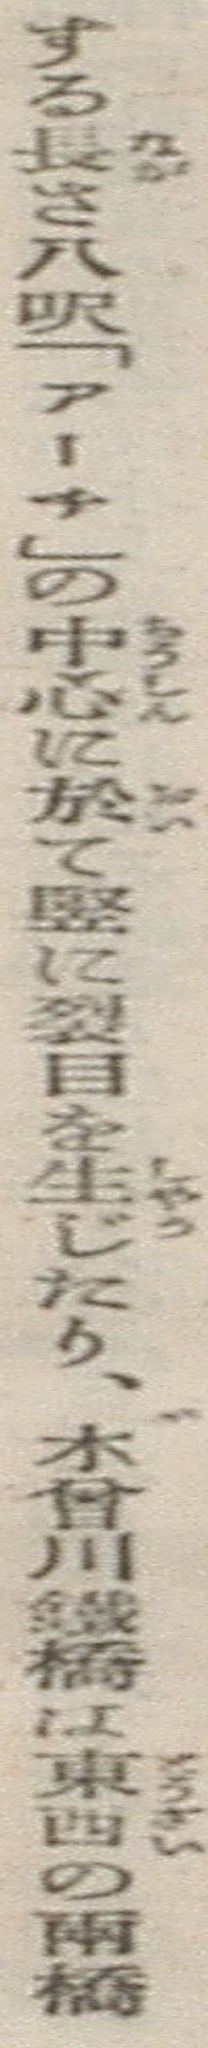する長さ八呎「アーチ」の中心に於て竪に割目を生じたり、木曽川鐡橋は東西の兩橋
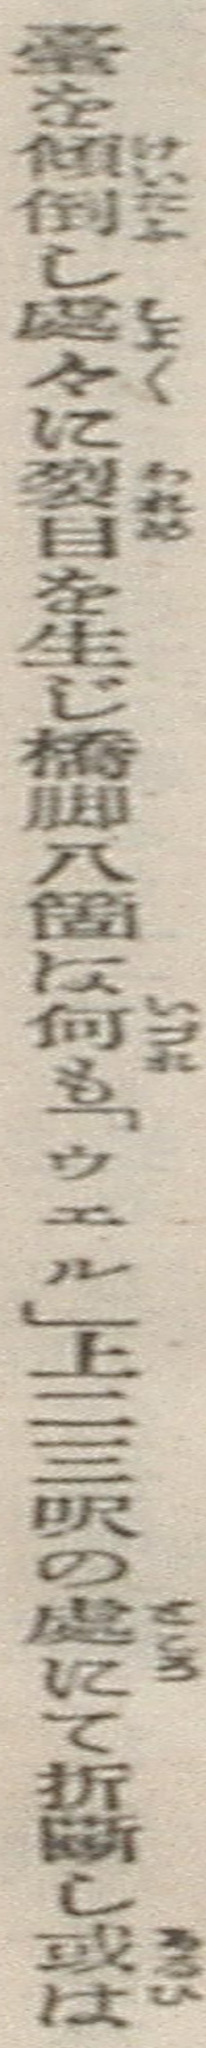臺を傾倒し處々に裂目を生じ橋脚八箇は何も「ウエル」上二三呎の處にて切斷し或は
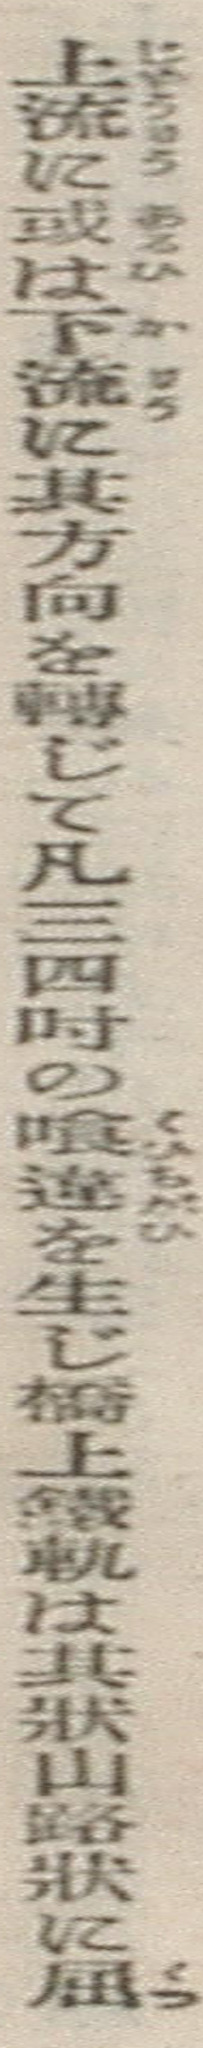上流に或は下流に其方向を転じて凡三四吋の喰違を生じ橋上鐡軌は其状山路状に屈（くつ
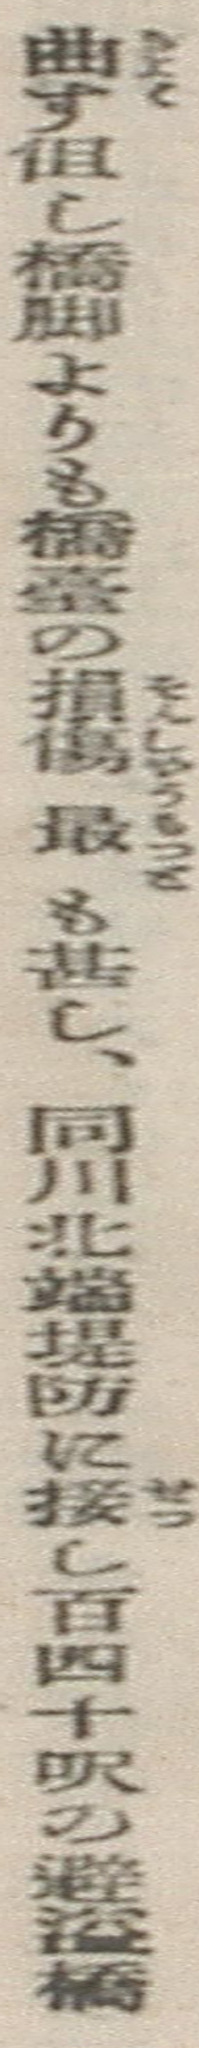曲す但し橋脚よりも橋臺の損傷最も甚し、同川北端堤防に接し百四十呎の避溢橋

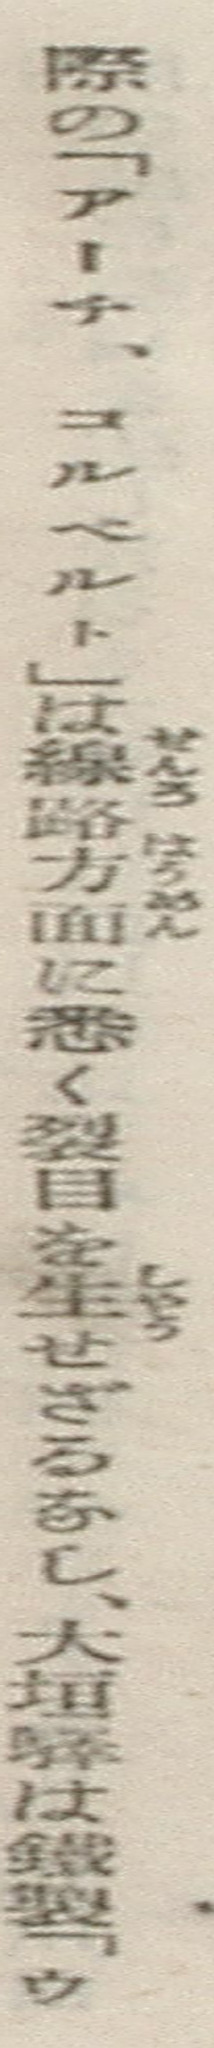際の「アーチ、コルベルト」は線路方面に悉く裂目を生ぜざるなし、大垣驛は鐡製「ウ
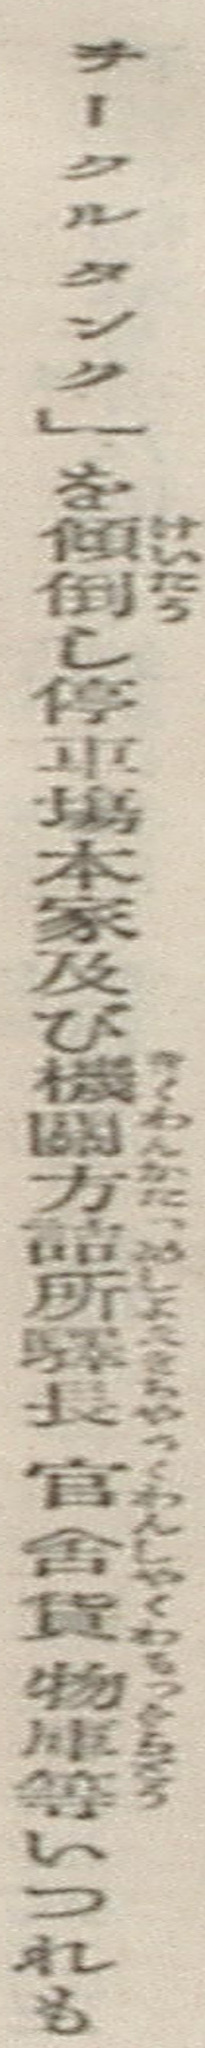チ－クルタンク」を傾倒し停車場本家及び機関方詰所驛長官舎貨物庫等いつれも
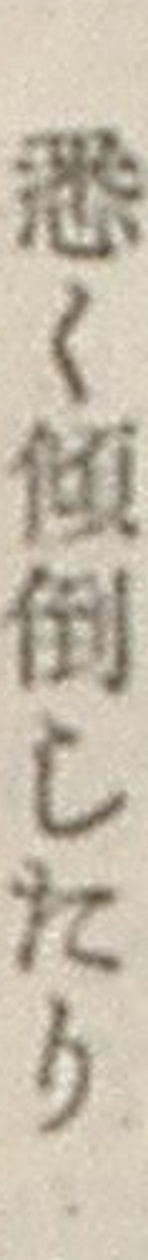悉く傾倒したり
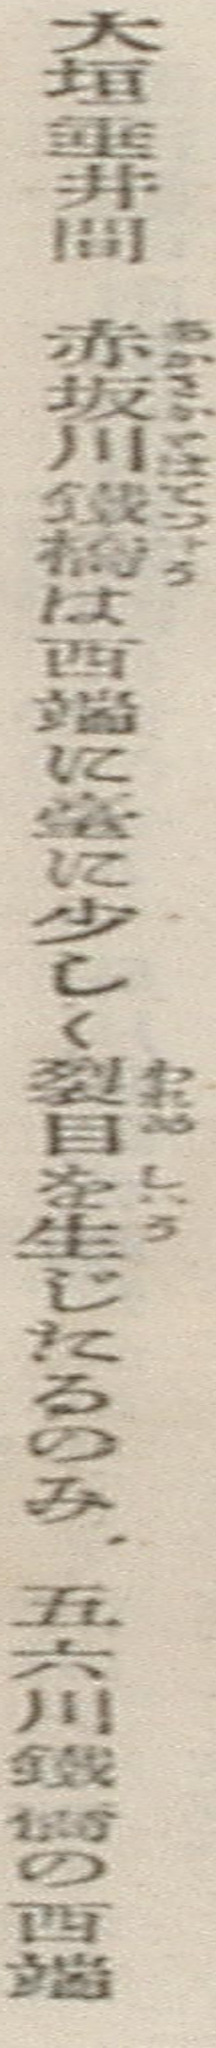大垣垂井間赤坂川鐡橋は西端に臺に少しく裂目を生じたるのみ、五六川鐡橋の西端
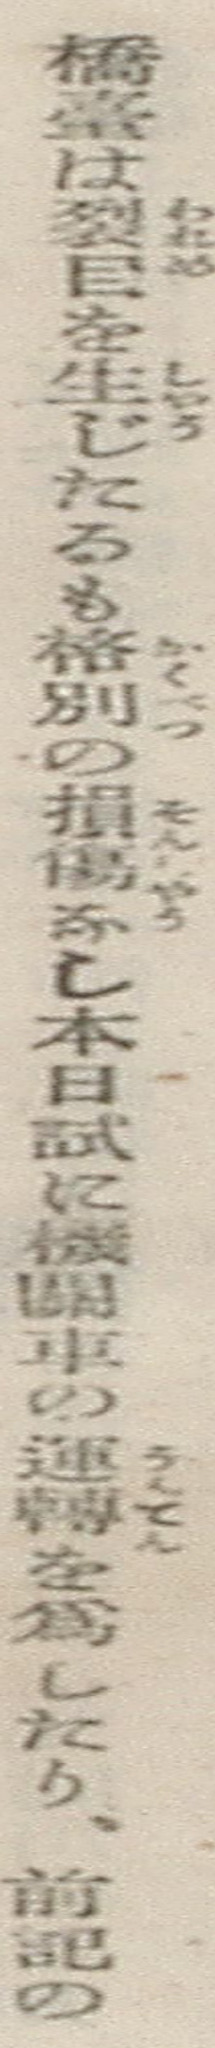橋臺は裂目を生じたるも格別の損傷なし本日試に機関車の運転を為したり、前記の
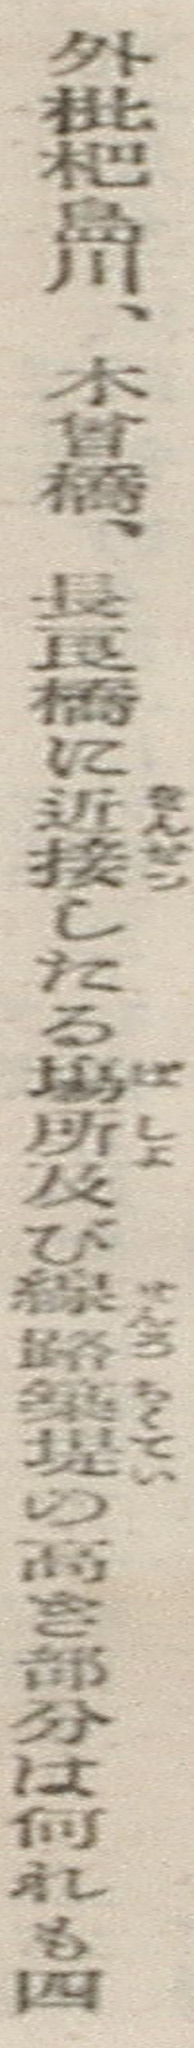外枇杷島川、木曽橋、長良橋に近接したる場所及び線路築堤の高き部分は何れも四
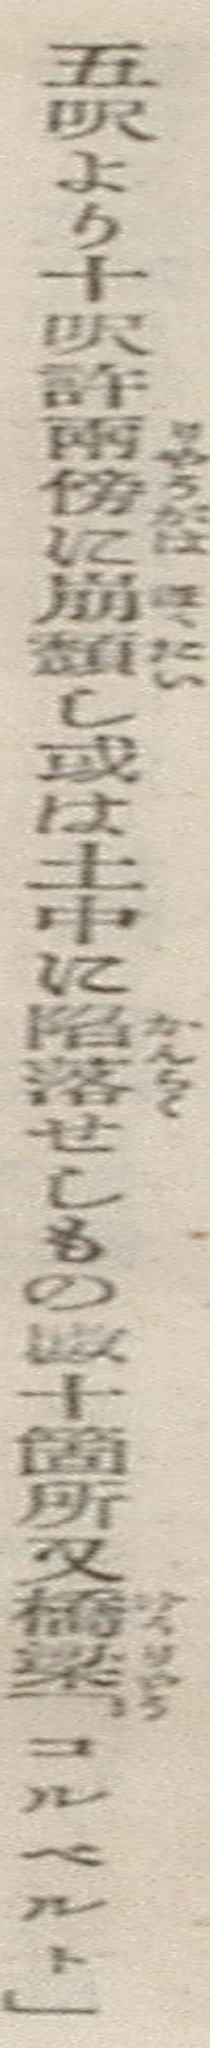五呎より十呎許兩傍に崩頽し或は土中に陥落せしもの數十箇所又橋梁「コルベルト」
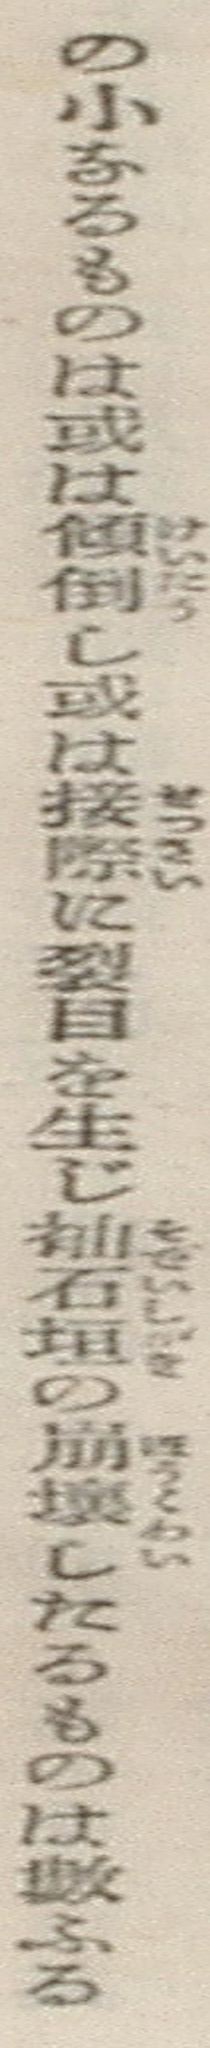の小なるものは或は傾倒し或るは接際に割目を生じ袖石垣の崩壊したるものは數ふる
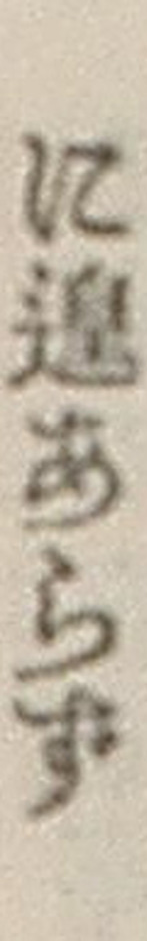に遑あらず
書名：愛知岐阜福井三県　大地震見聞録（内題）
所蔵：東京大学地震研究所図書室 Earthquake Research Institute Library, The University of Tokyo, JAPAN
